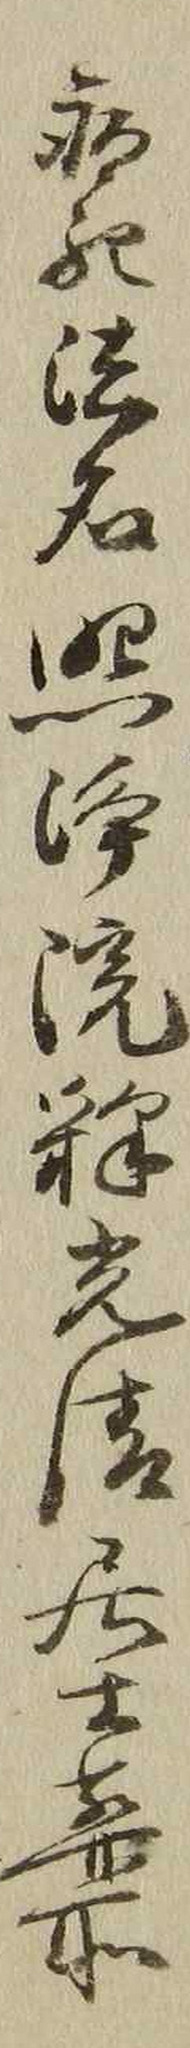病死法名照浄院釈光清居士葬所
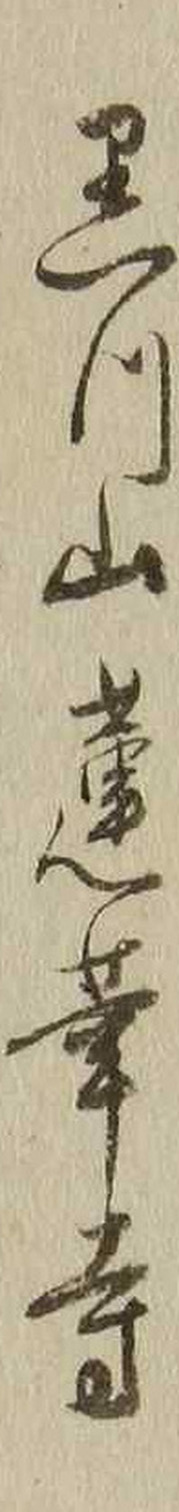黒川山蓮華寺
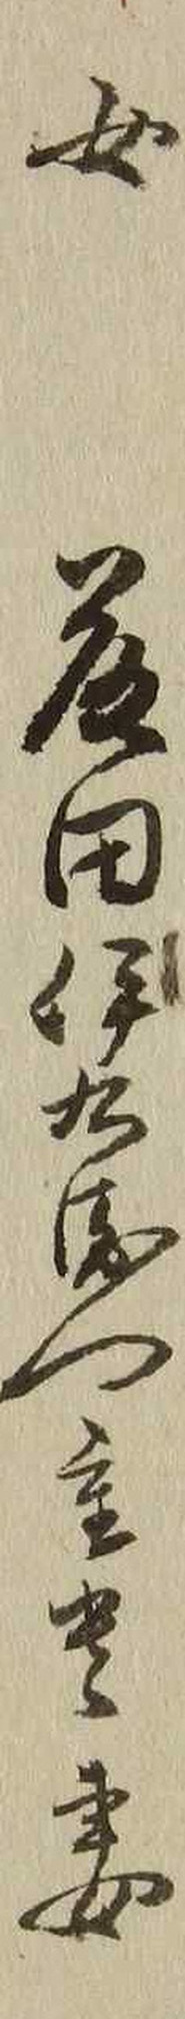女藤田伊九衛門重貴妻
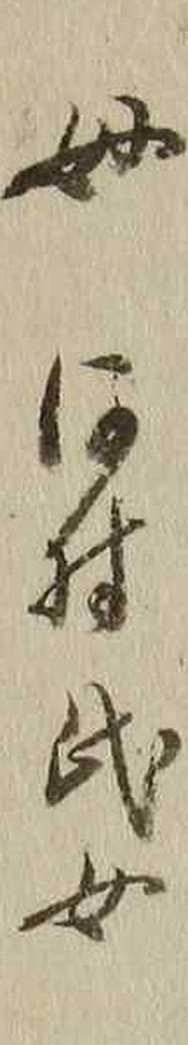母河村氏女
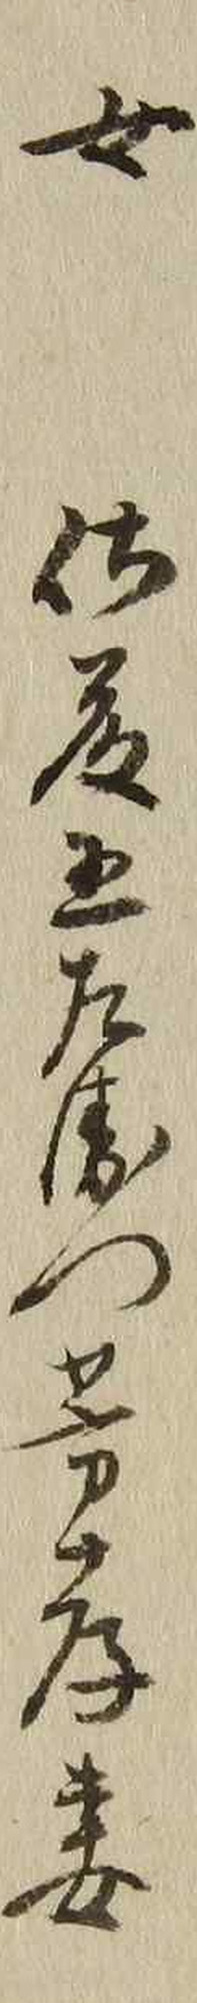女佐藤五左衛門芳孝妻
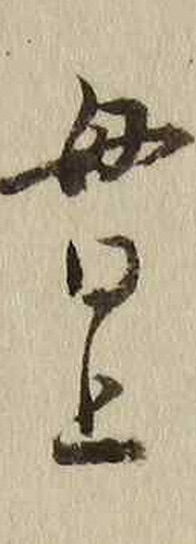母同上
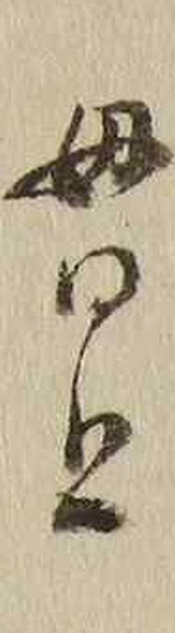母同上
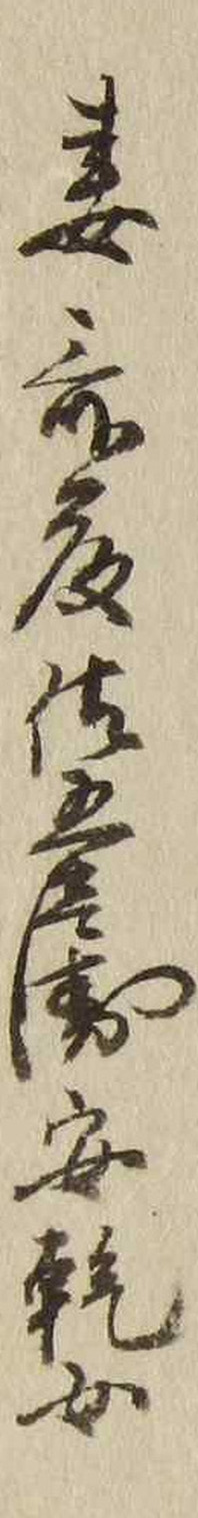妻斎藤佐五兵衛安乾女

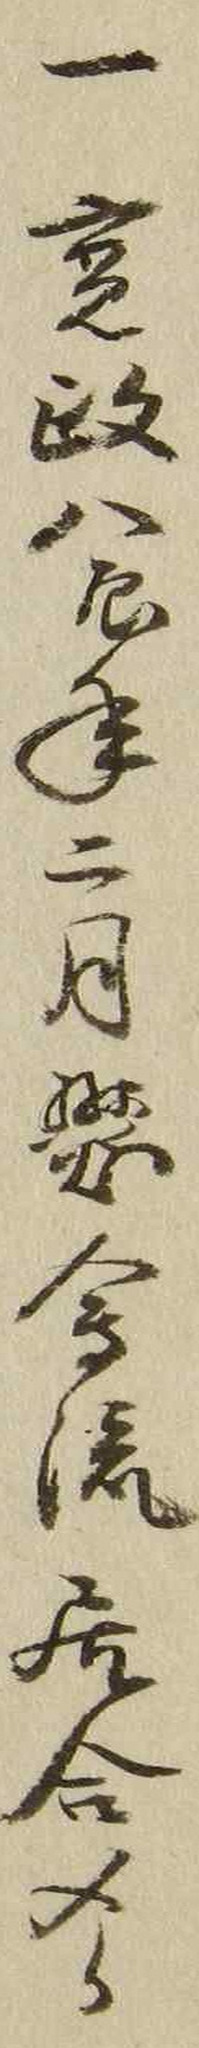一寛政八辰年二月礬会流居合〆り
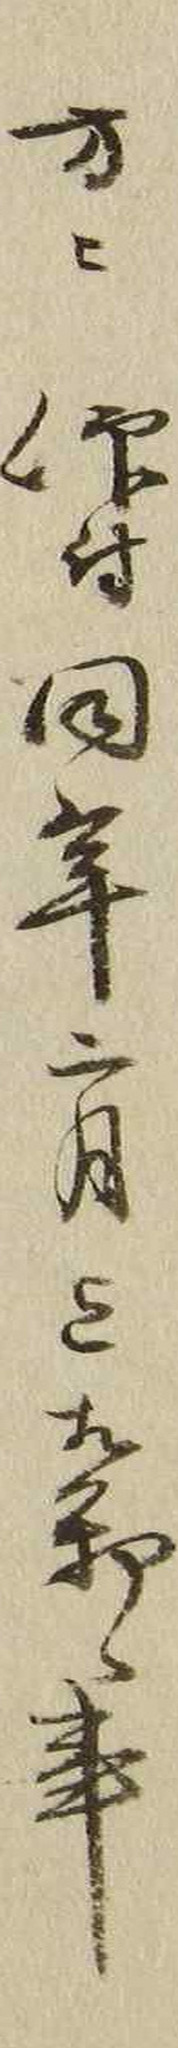方被仰付同年二月迄相勤候事
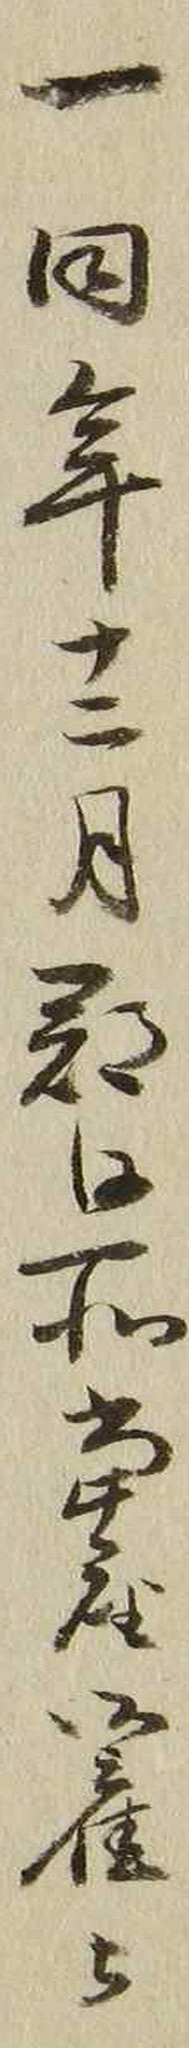一同年十二月郡役所当座御雇被
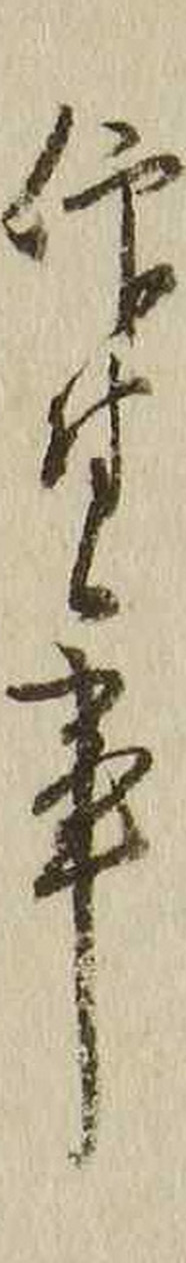仰付候事
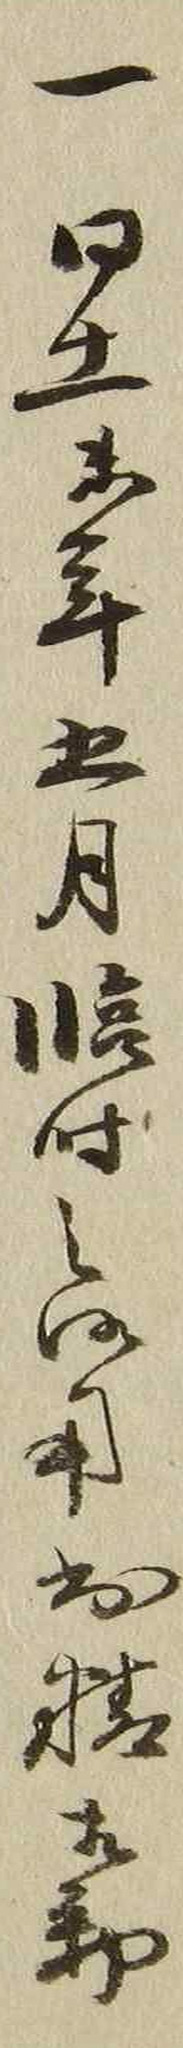一同十一未年五月臨時之御用出精相勤
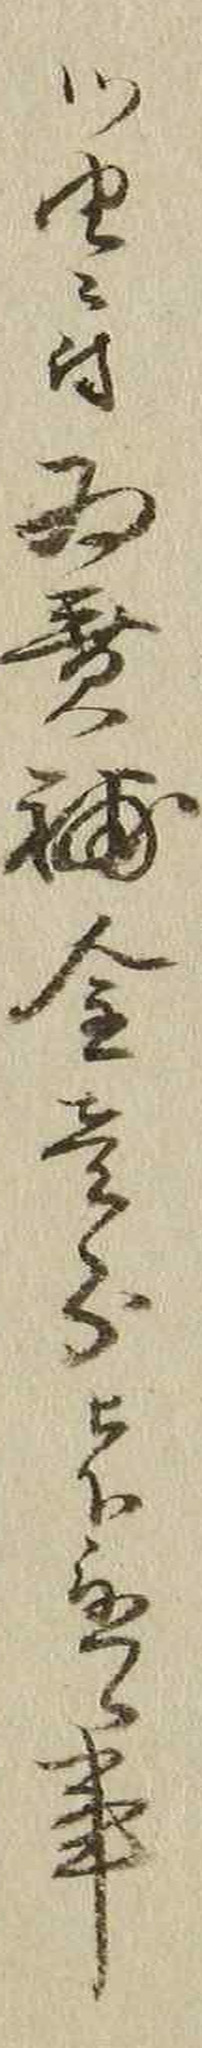候由ニ付為費補金壱分被下置候事
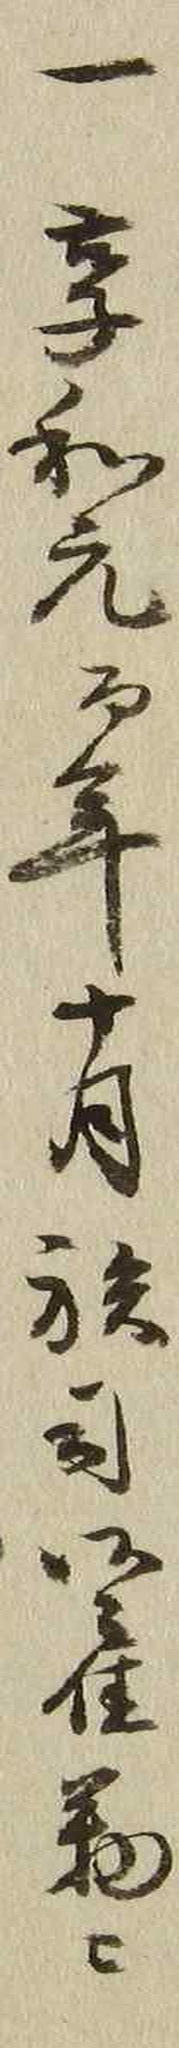一享和元酉年十月族司御雇勤被
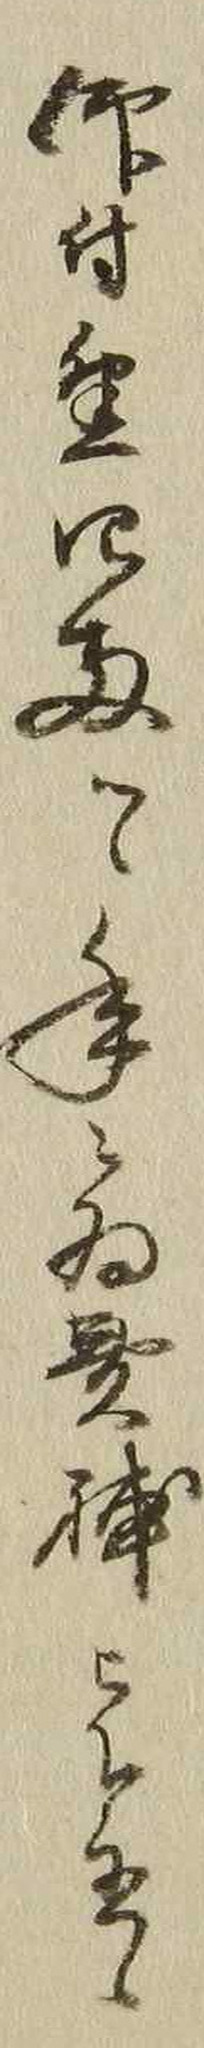仰付金四両ツヽ年々為費補被下置候
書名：諸士系譜　巻之236　ふ之部4
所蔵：会津若松市立会津図書館
